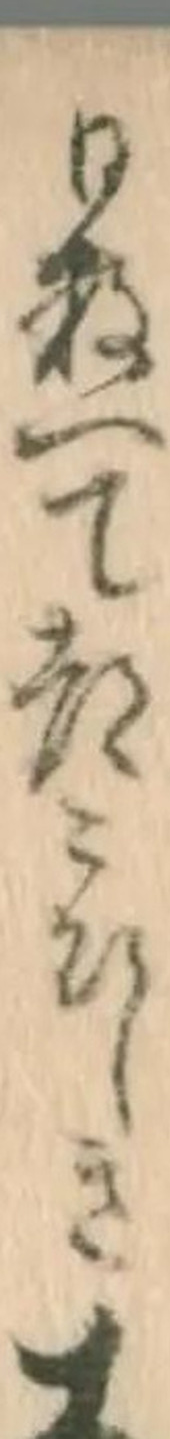日数へて都こひしき
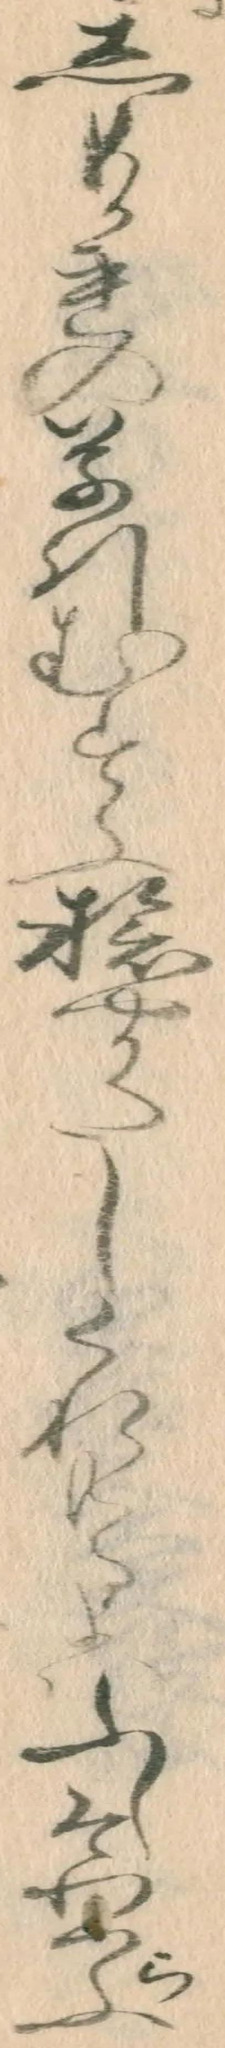しもかれの草引むすふ旅やかたしくれもるよはふしそわつらふ
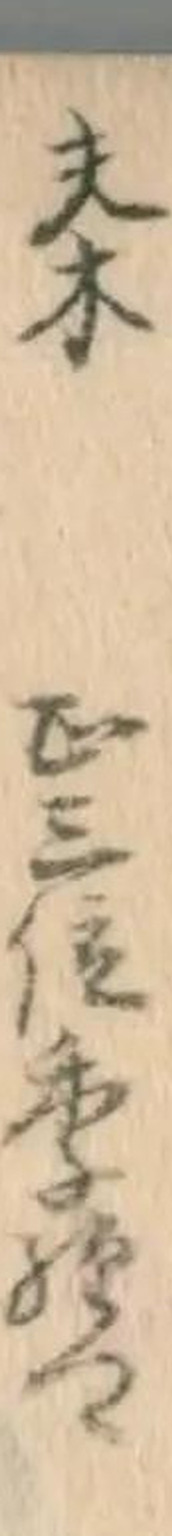夫木正三位季経卿
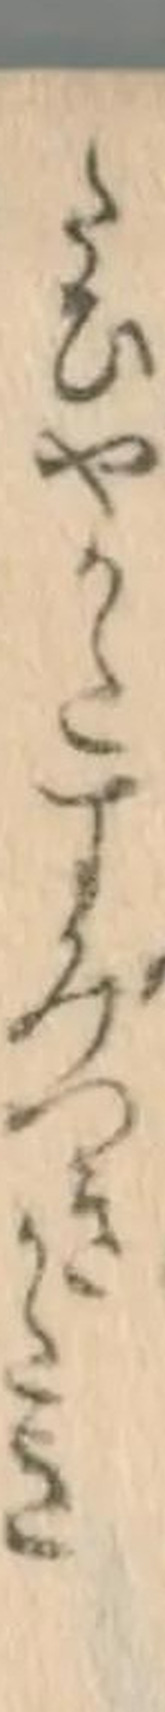たひやかたすみつきかたき
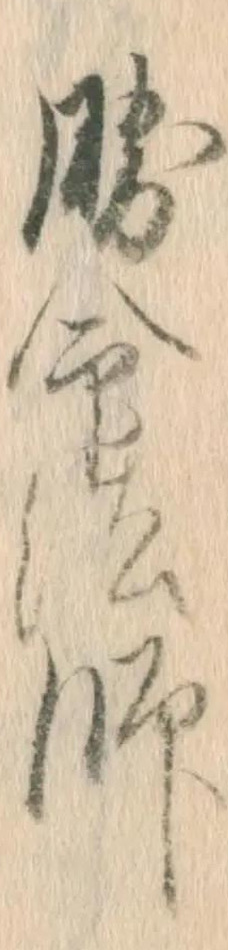勝命法師
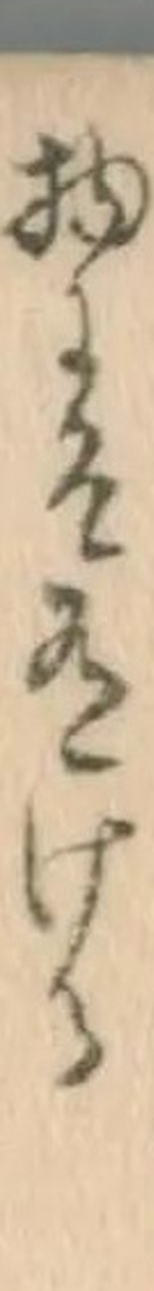物にそ有ける
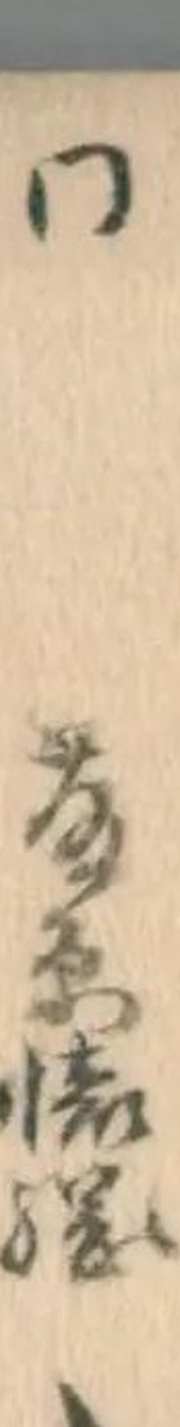同藤原懐綱
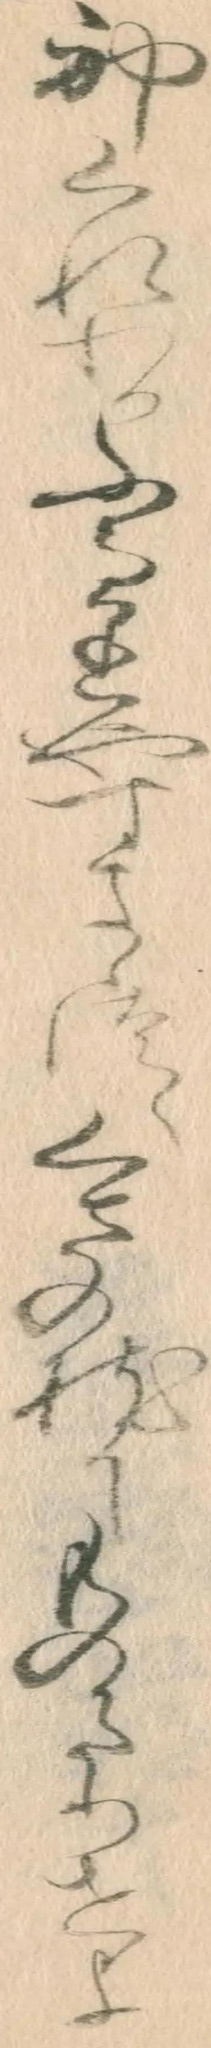初しくれわかふる里やすきゝつゝくさの枕にものかたりせよ
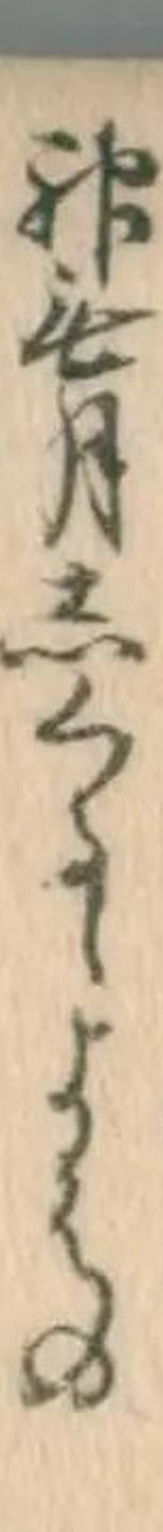神無月しくるゝよはの
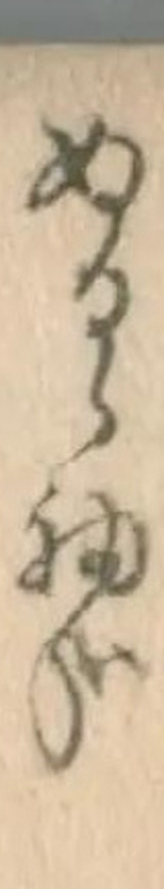ぬるゝ袖哉
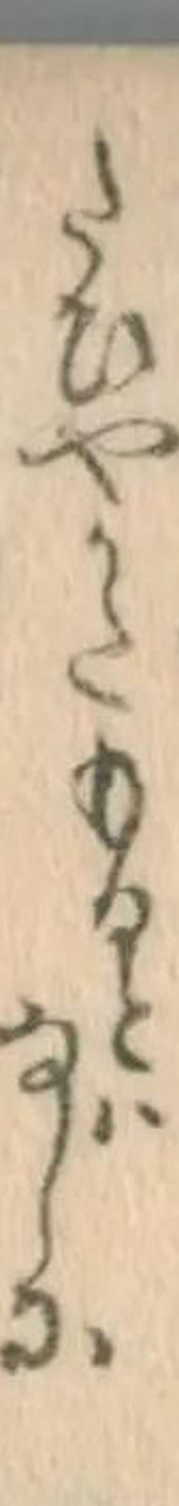たひやかたもるとはなしに
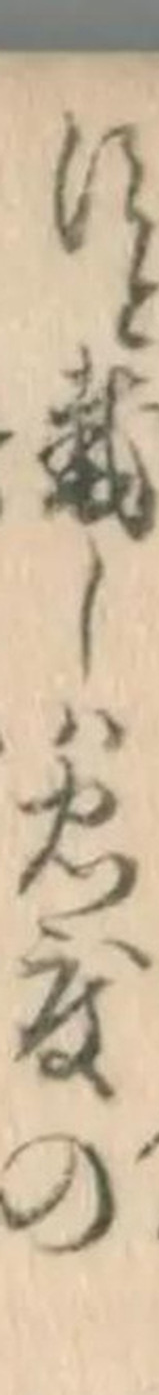すと載しは忠度の
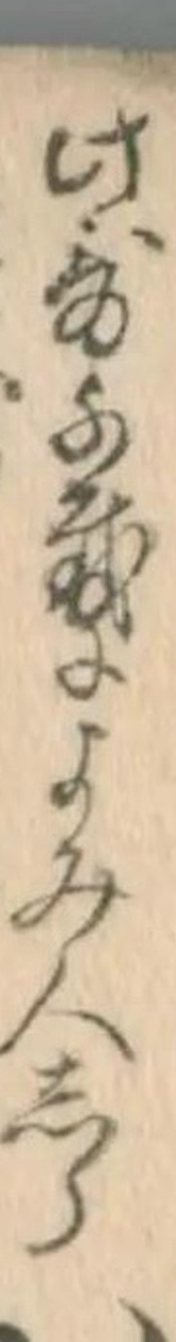此歌千載によみ人しら
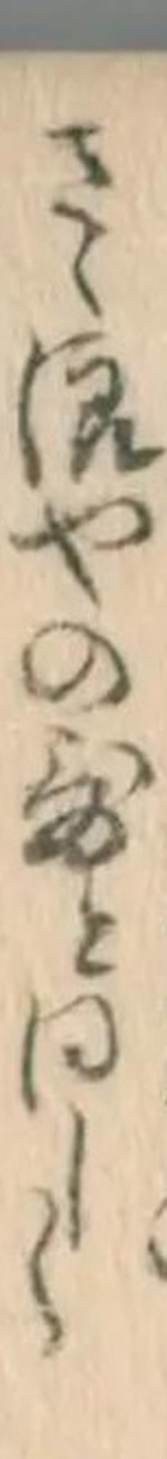さゝ浪やの歌と同しく
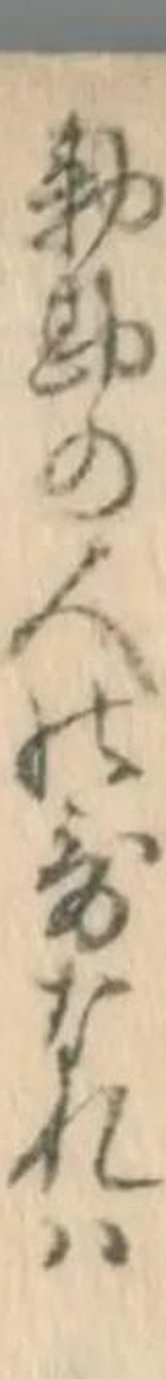勅勘の人の歌なれは
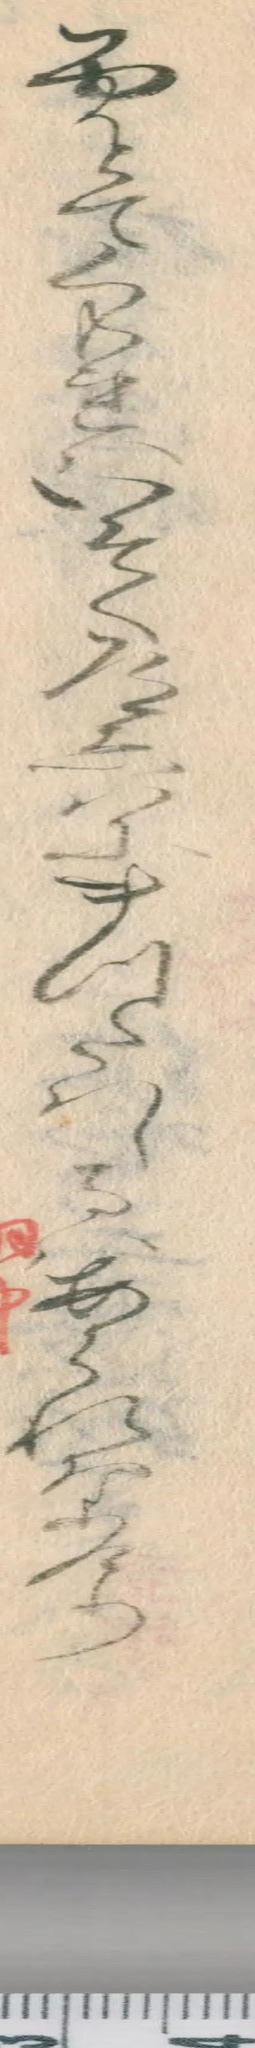雨かとてくもれはいそく道しはにまつたはしるはあられなりけり
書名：月詣和歌集
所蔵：国立国会図書館 National Diet Library, JAPAN
